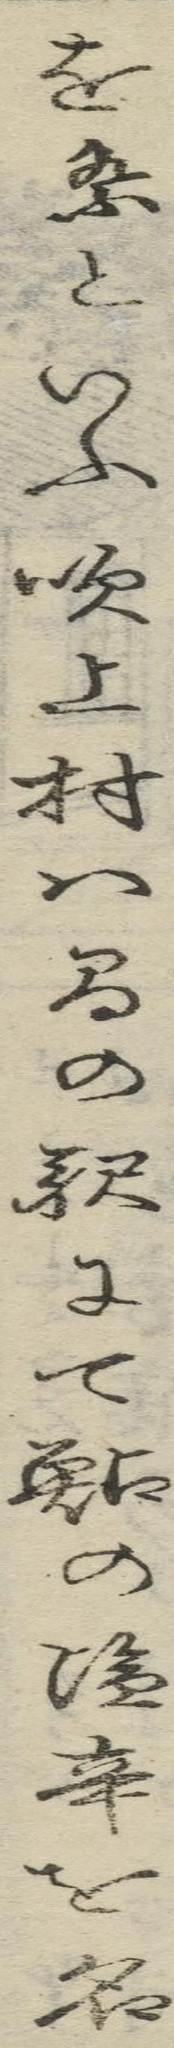を祭といふ吹上村は間の駅にて鮎の塩辛を名
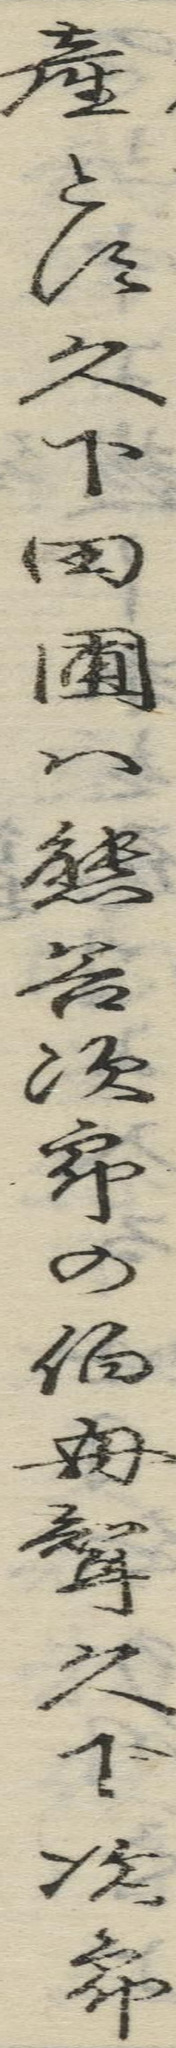産とす久下田圃は熊谷次郎の伯母聟久下次郎
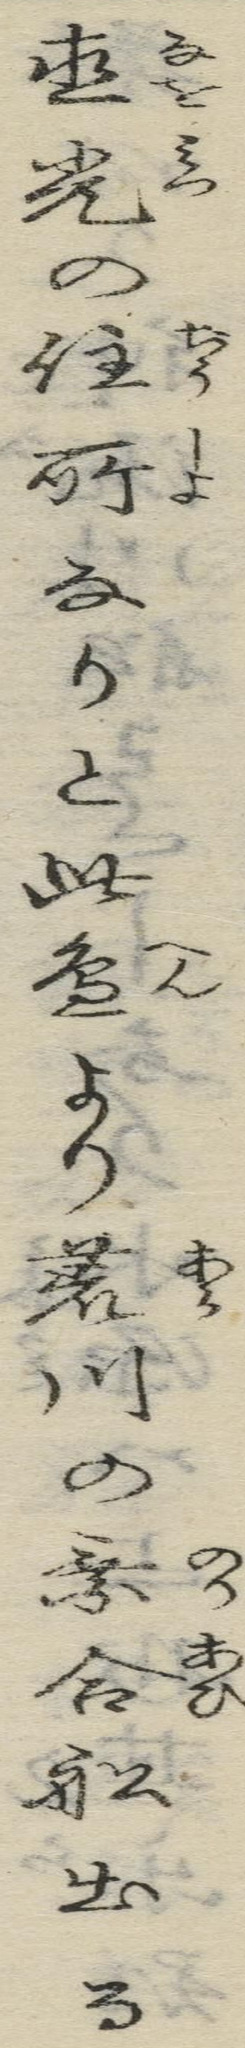直光の住所なりと此辺より荒川の乗合船出る
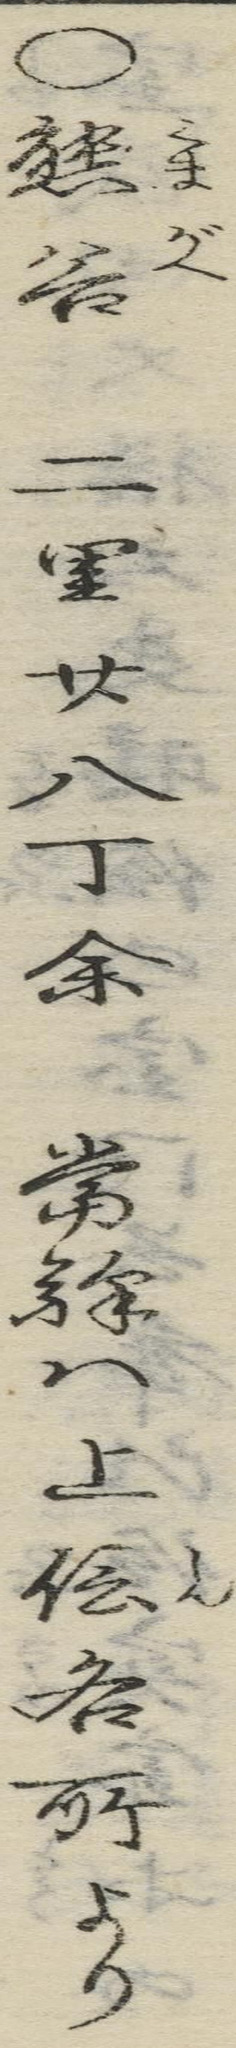○熊谷二里廿八丁余当駅は上信各所より
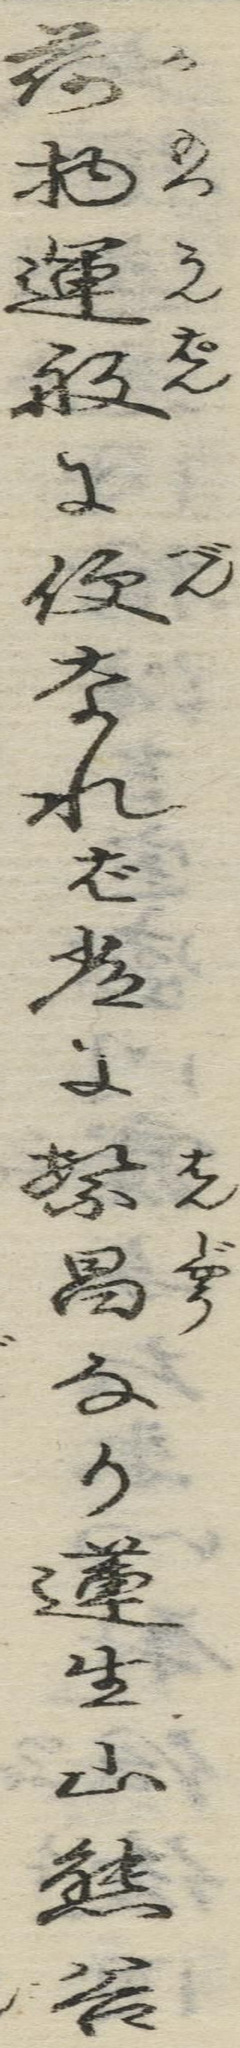貨物運般に便なれば常に繁昌なり蓮生山熊谷
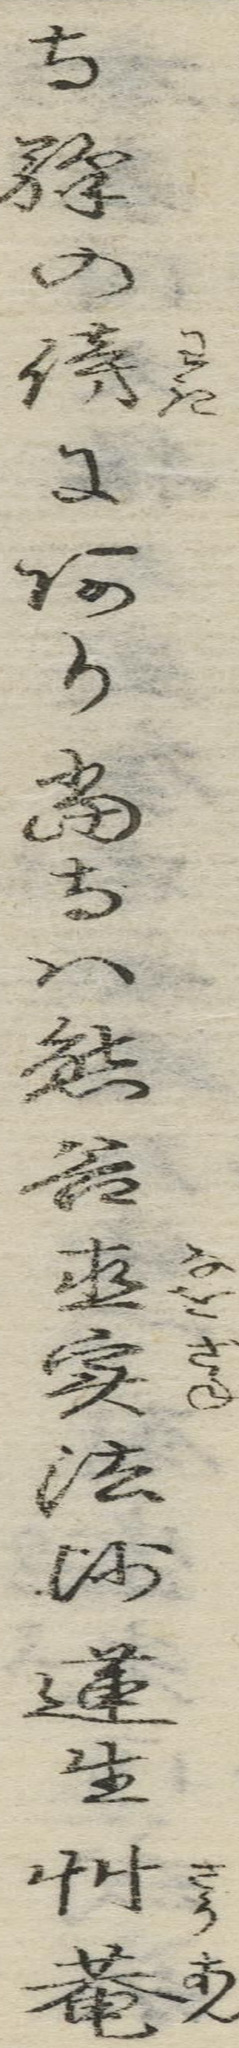寺駅の傍にあり当寺は熊谷直実法師蓮生草庵
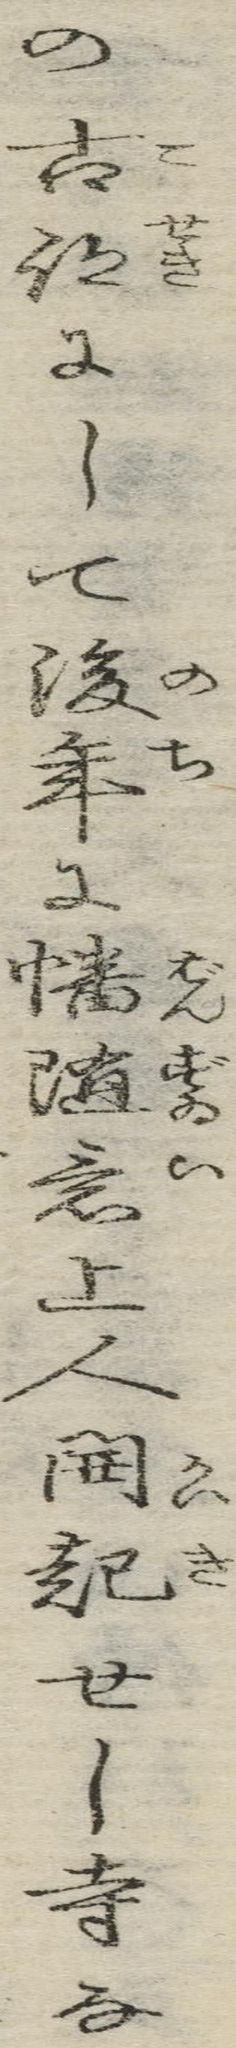の古跡にして後年に幡随意上人開起せし寺な
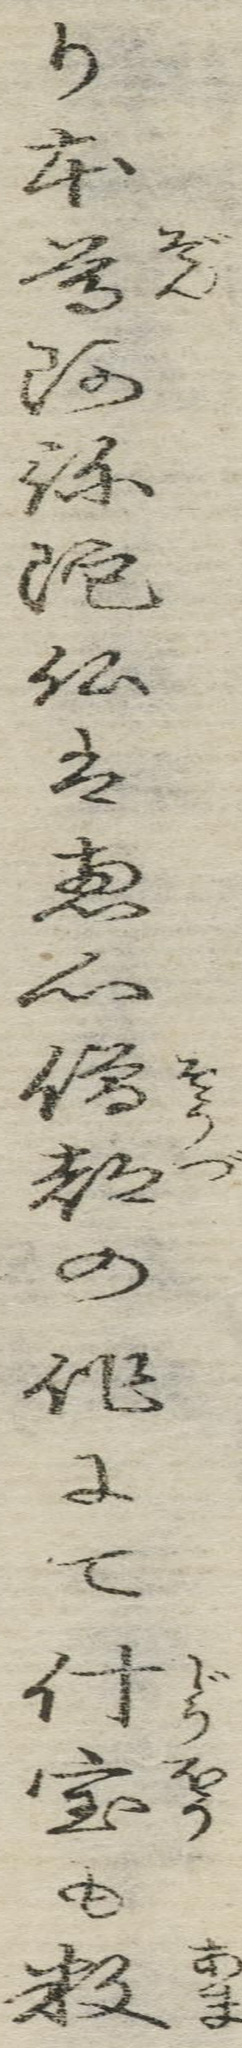り本尊阿弥陀仏は恵心僧都の作ににて什宝も数
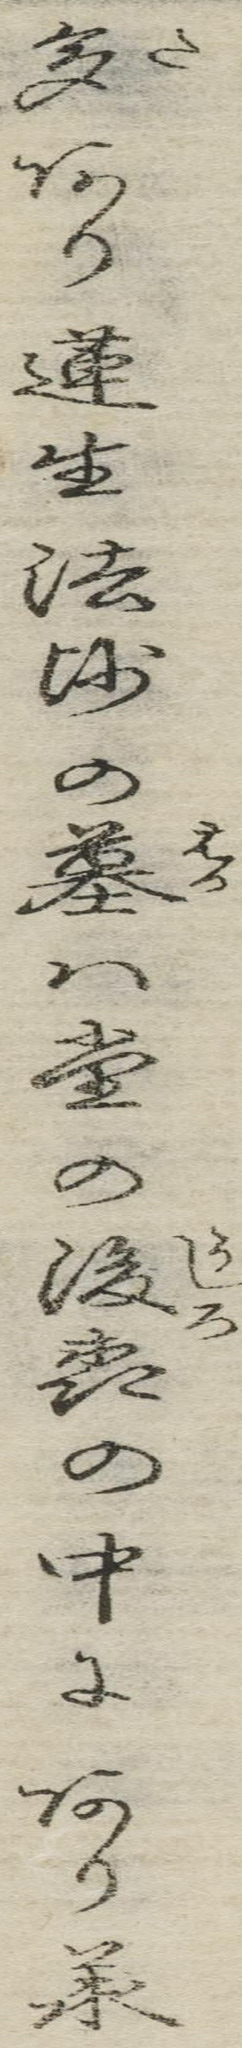多あり蓮生法師の墓は堂の後森の中にあり承
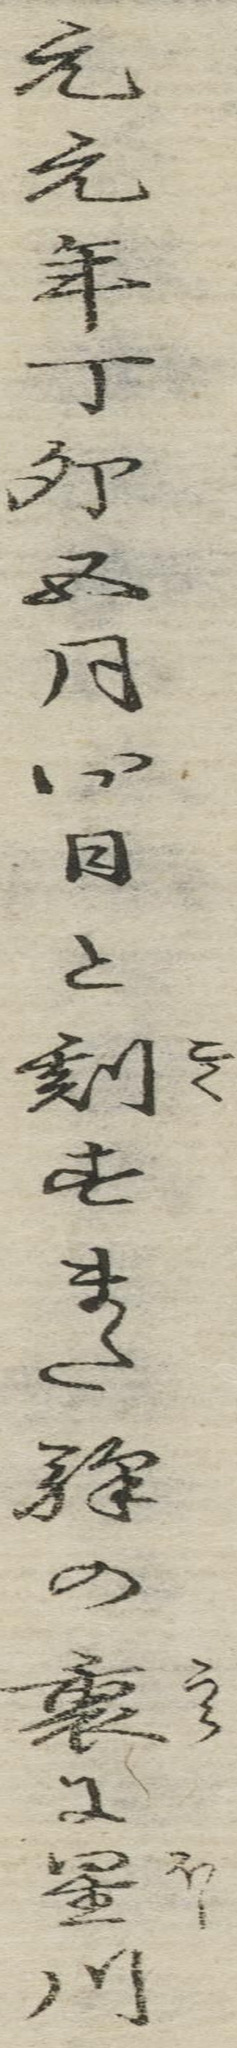元元年丁卯五月四日と刻すまた駅の裏に星川
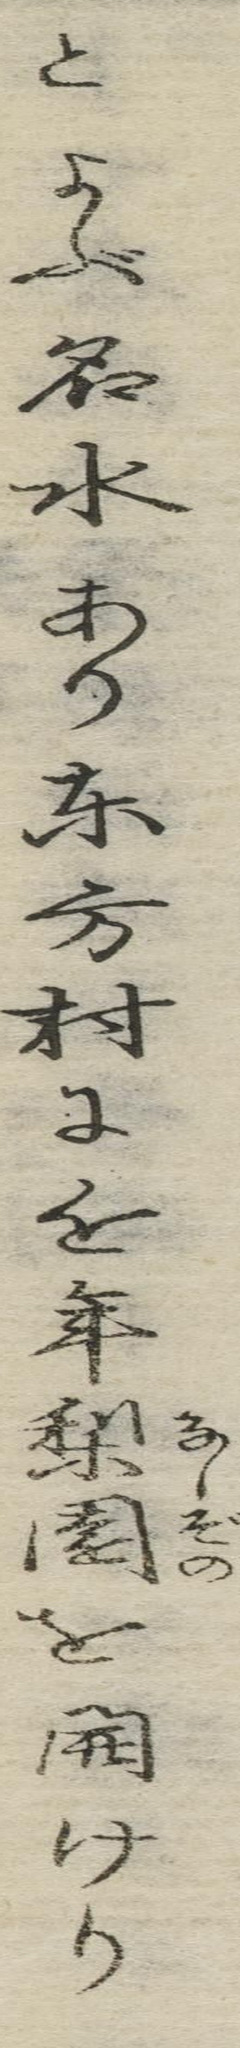とよぶ名水あり東方村に近年梨園を開けり
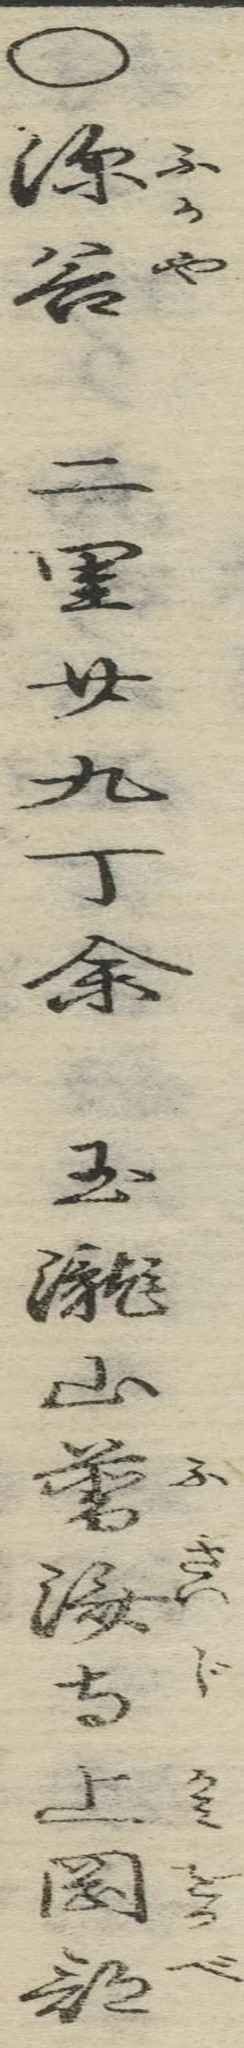○深谷二里二十九丁余玉瀧山普済寺上岡部

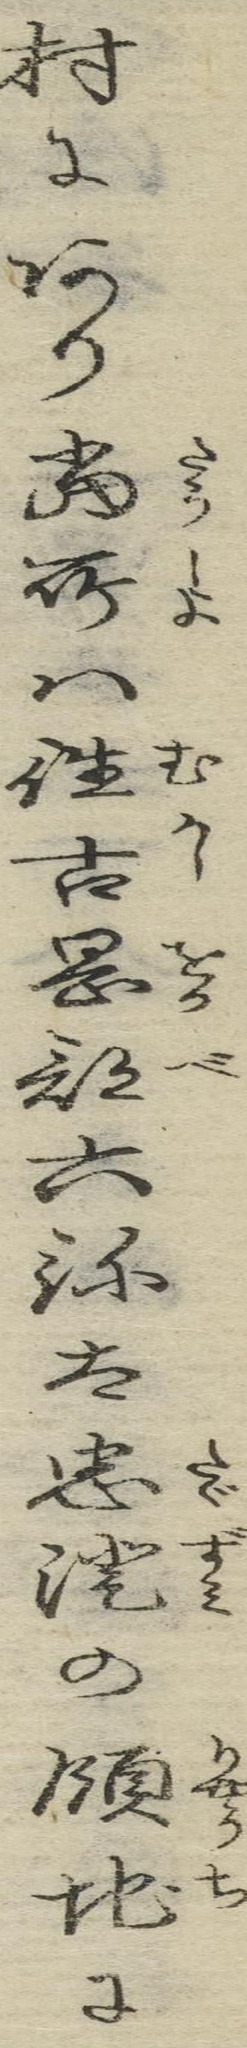村にあり当所は往古岡部六弥太忠澄の領地に
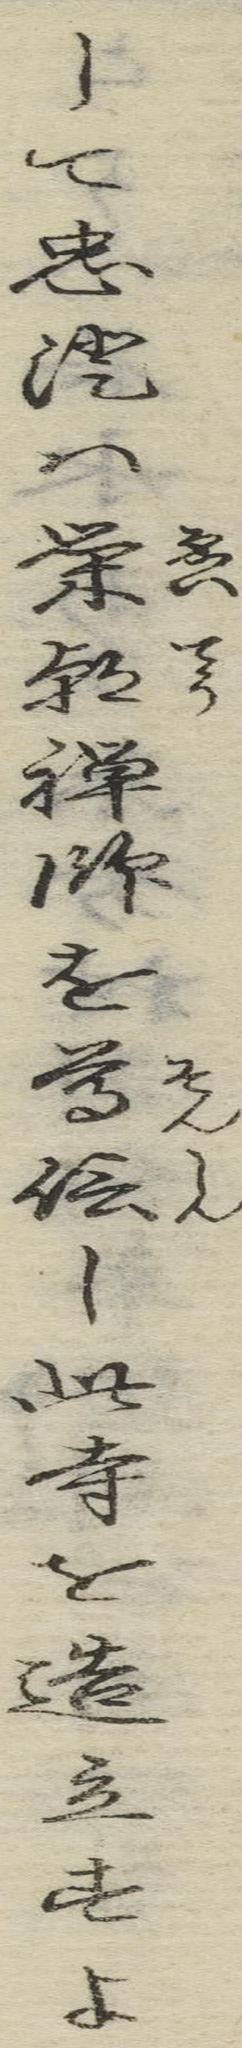して忠澄は栄朝禅師を尊信し此寺を造立すよ
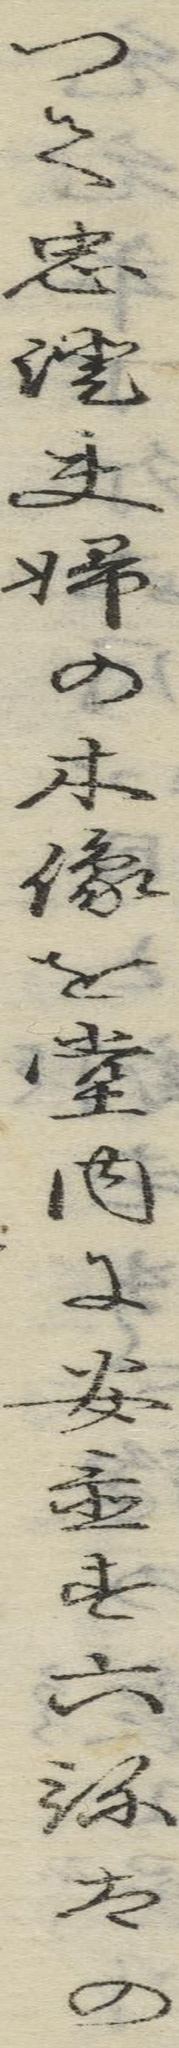つて忠澄夫婦の木像を堂内に安置す六弥太の
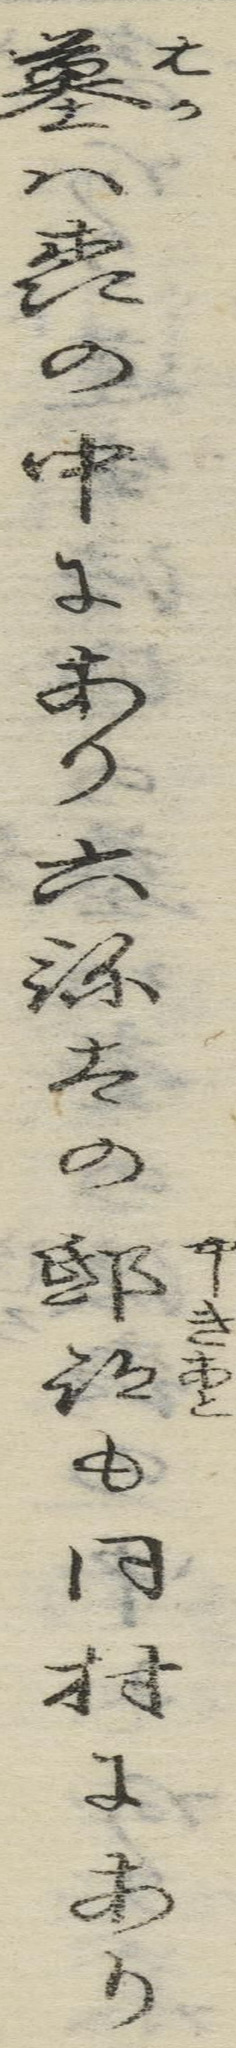墓は森の中にあり六弥多の邸跡？も同村にあり
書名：上州伊香保鑛泉圖會　全
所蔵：東京大学地震研究所図書室 Earthquake Research Institute Library, The University of Tokyo, JAPAN
